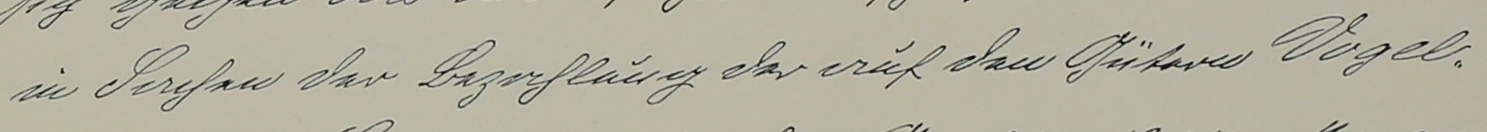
in Sachen der Bezahlung der auf den Gütern Vogel-
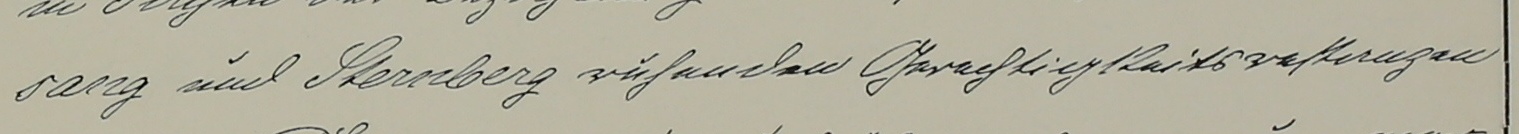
sang und Sternberg ruhenden Gerechtigkeitsrestanzen
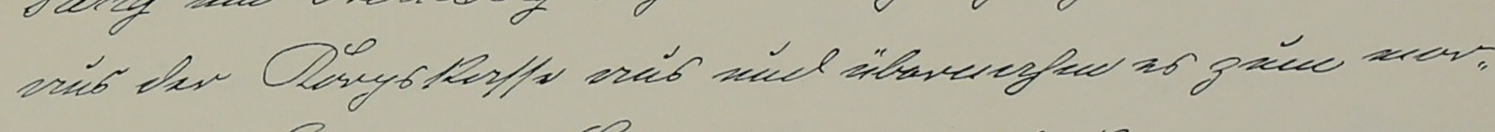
aus der Korpskasse aus und übernahm es, zum mor-
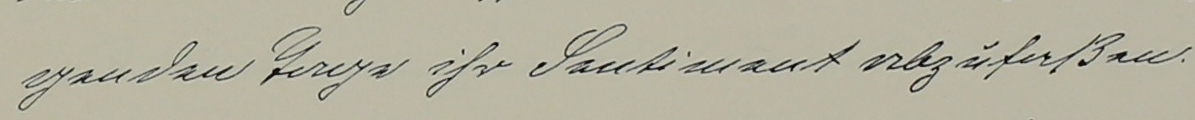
genden Tage ihr Sentiment abzufaßen.
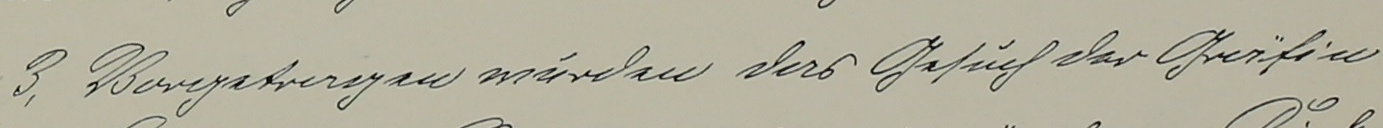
3. Vorgetragen wurden das Gesuch der Gräfin
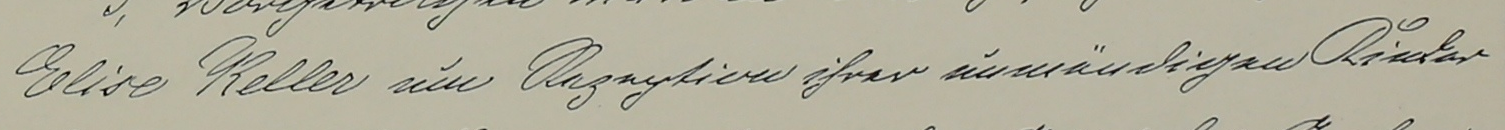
Elise Keller um Rezeption ihrer unmündigen Kinder
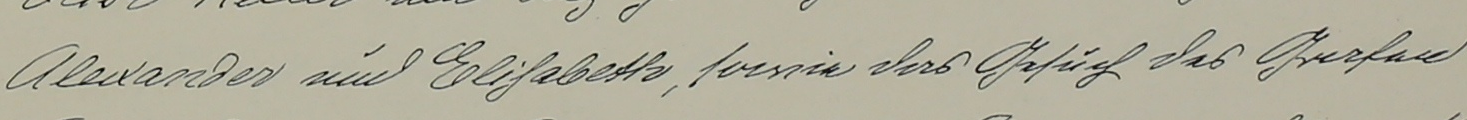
Alexander und Elisabeth, sowie das Gesuch des Grafen
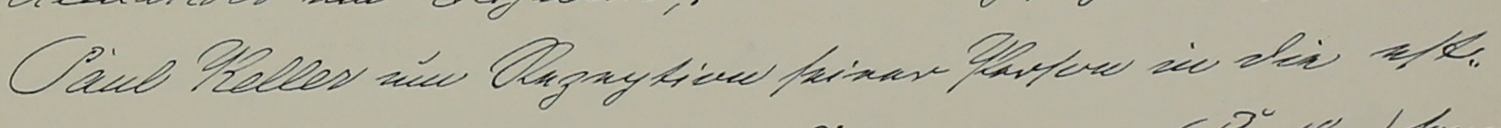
Paul Keller um Rezeption seiner Person in die est-
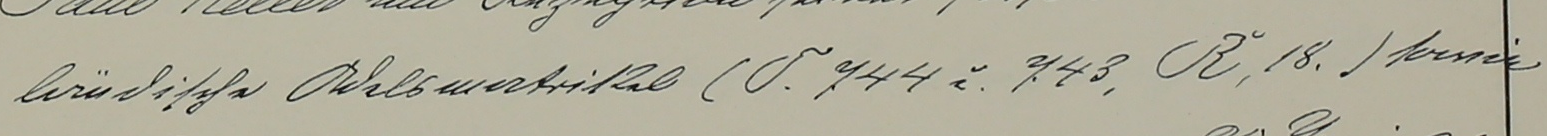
ländische Adelsmatrikel (T.744 u.743, R.18.) sowie
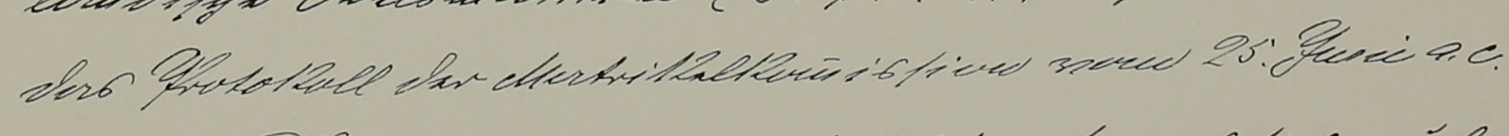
das Protokoll der Matrikelkommission vom 25. Juni a.c.
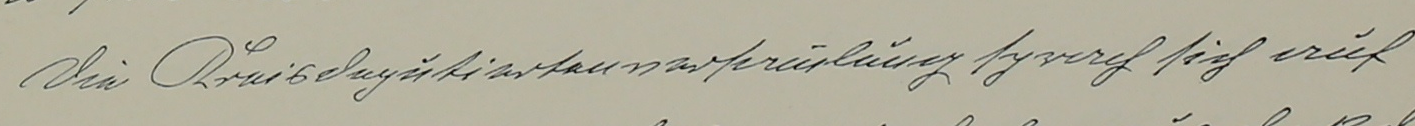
Die Kreisdeputiertenversammlung sprach sich auf
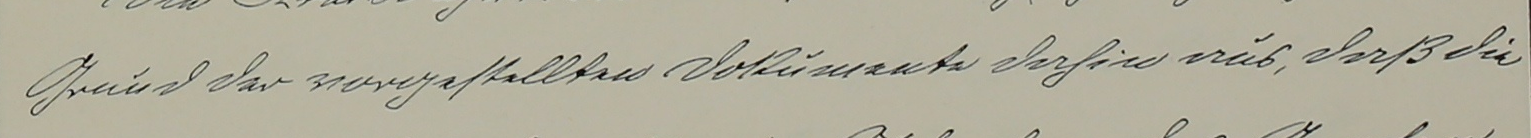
Grund der vorgestellten Dokumente dahin aus, daß die
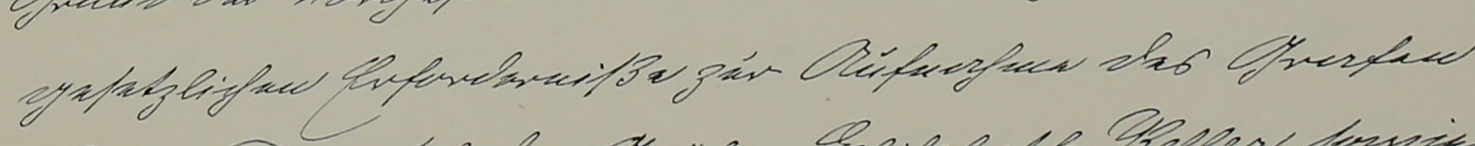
gesetzlichen Erforderniße zur Aufnahme des Grafen
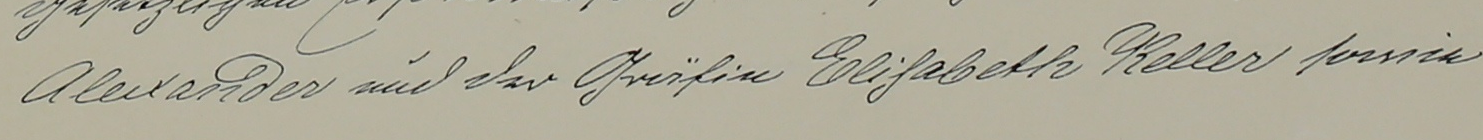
Alexander und der Gräfin Elisabeth Keller sowie
